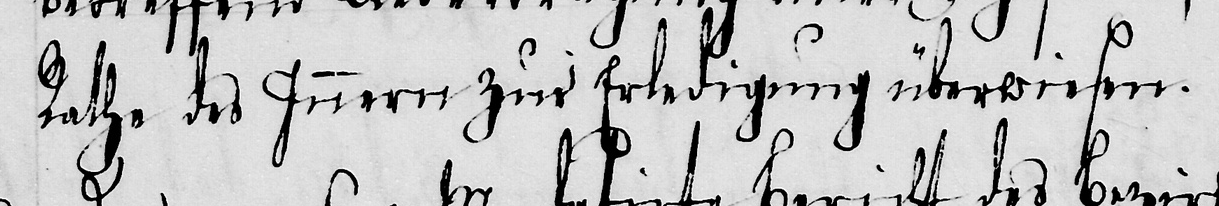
Rathe des Innern zur Erledigung überwiesen.
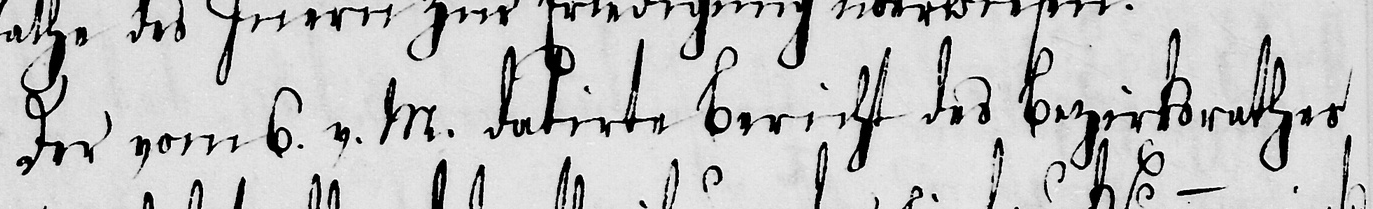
Der vom 6 v. M. datirte Bericht des Bezirksrathes
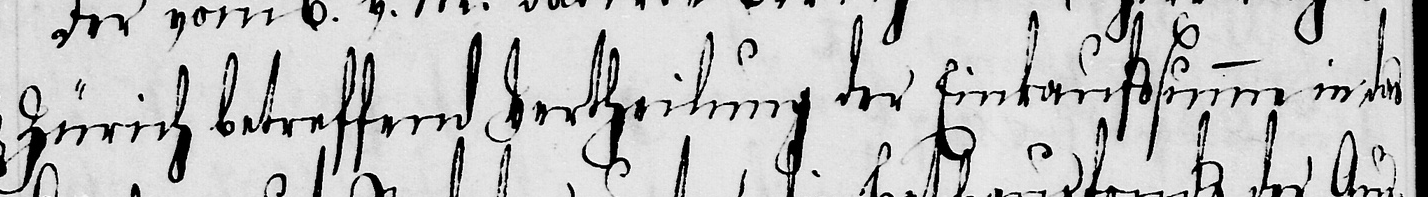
Zürich betreffend Vertheilung der Einkaufssumme in das
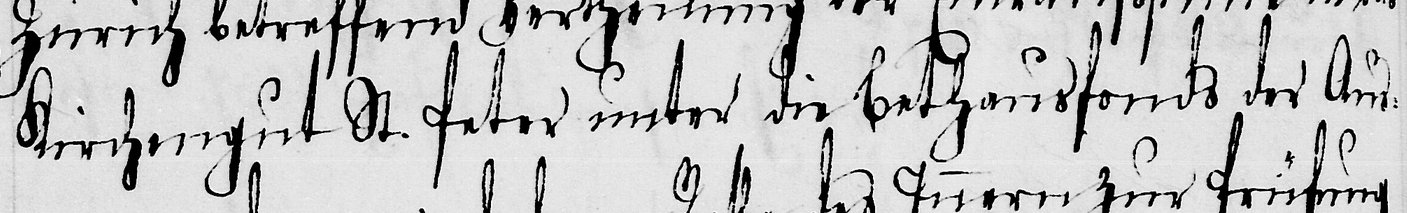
Kirchengut St. Peter unter die Bethausfonds der Aus¬
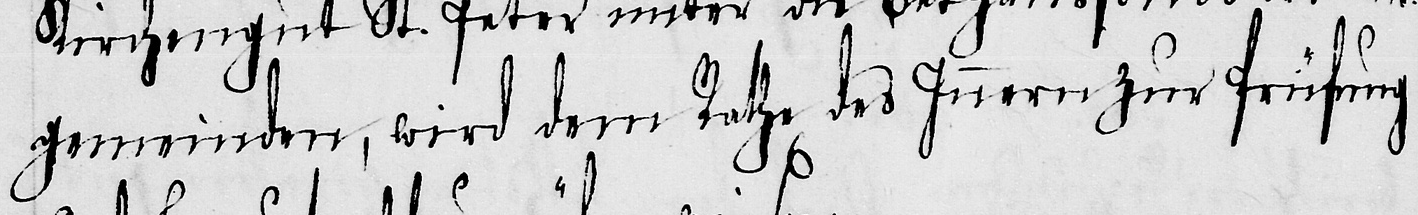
gemeinden, wird dem Rathe des Innern zur Prüfung
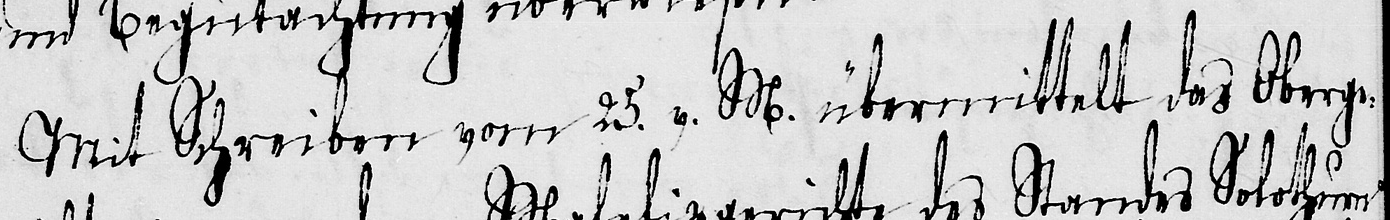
Mit Schreiben vom 25. v. M. übermittelt das Oberge¬
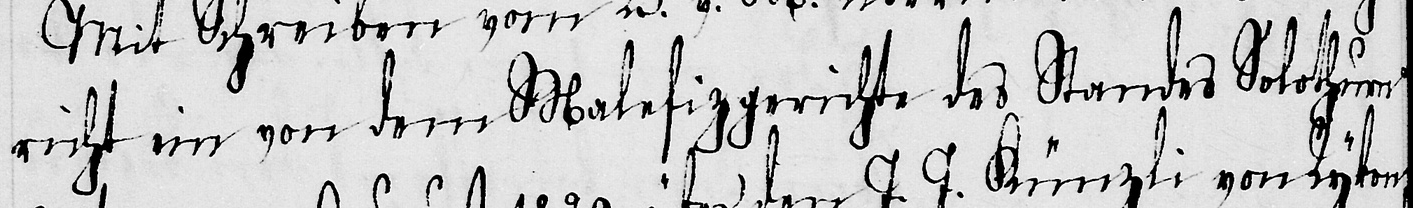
richt ein vom dem Malefizgerichte des Standes Solothurn
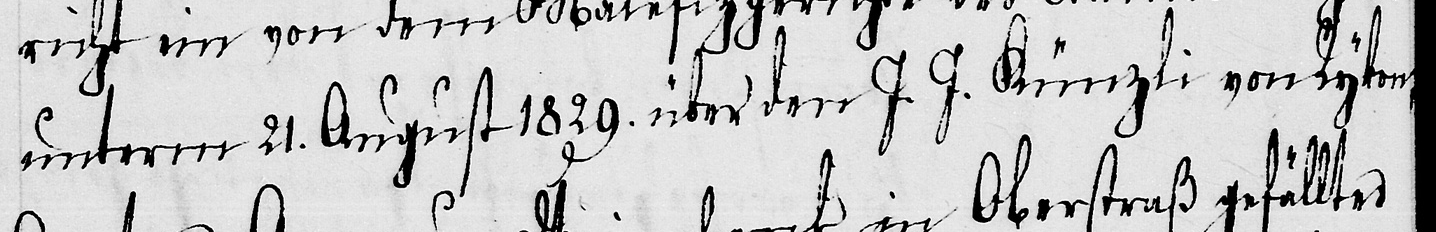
unterm 21. August 1829. über den J. J. Künzli von Rykon,
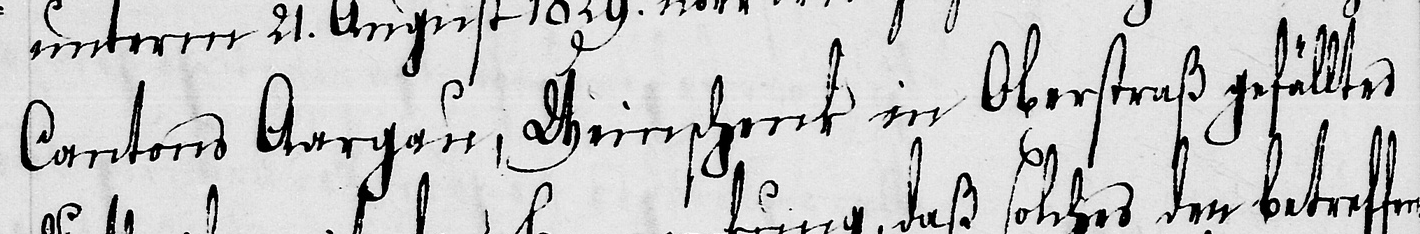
Cantons Aargau, Weinschenk in Oberstraß gefälltes
